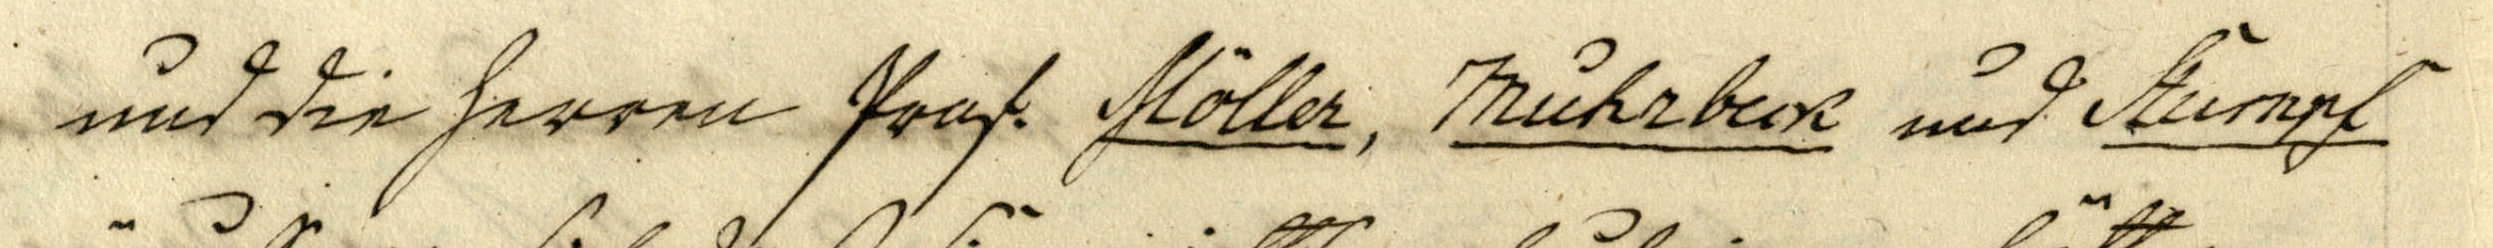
und die Herren Prof. Möller, Muhrbeck und Stumpf
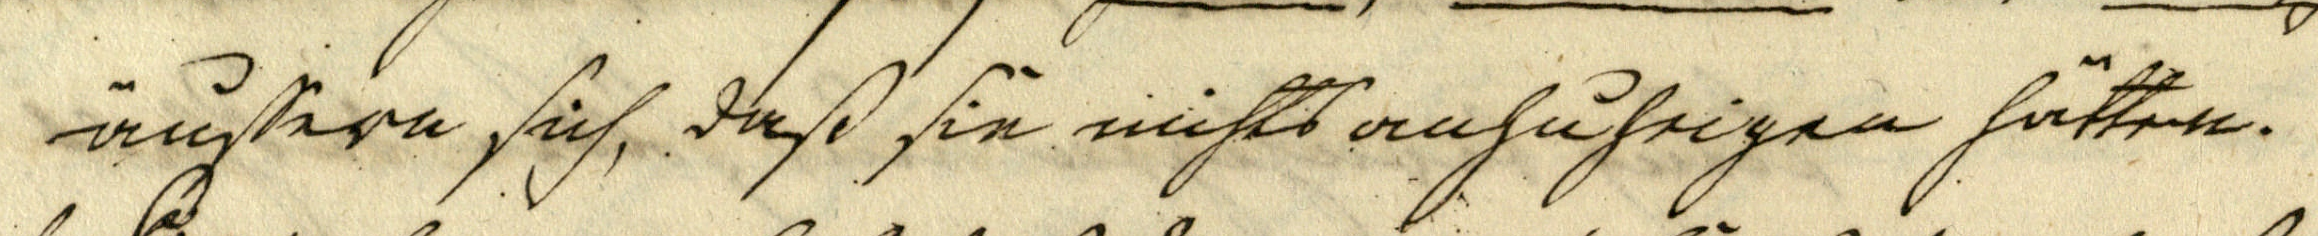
äussern sich, daß sie nichts anzuzeigen hätten.
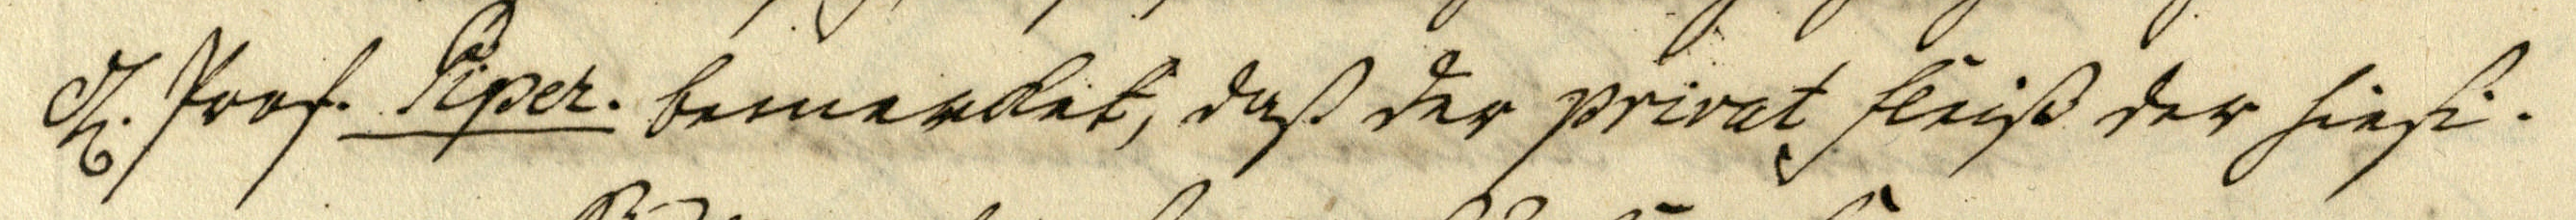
dh. Prof. Piper. bemerket, daß der privat Fleiß der hiesi-
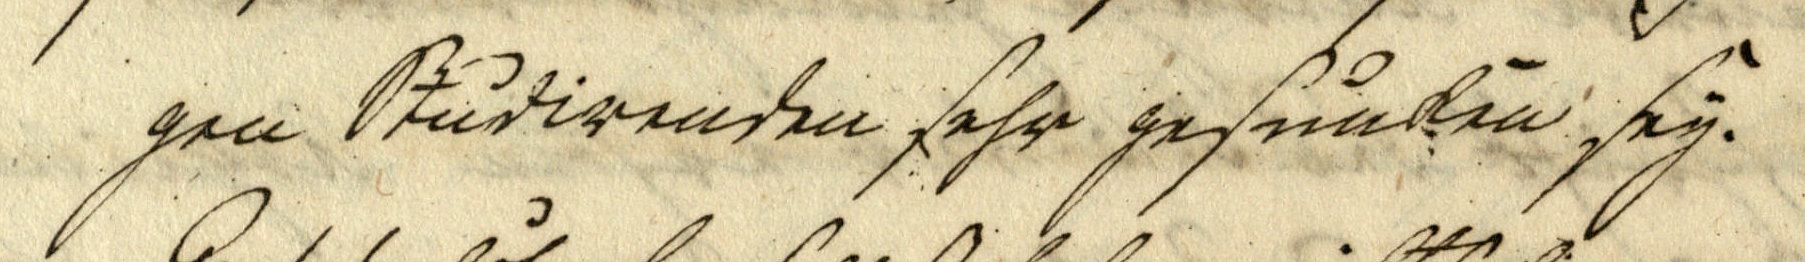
gen Studirenden sehr gesunken sey.
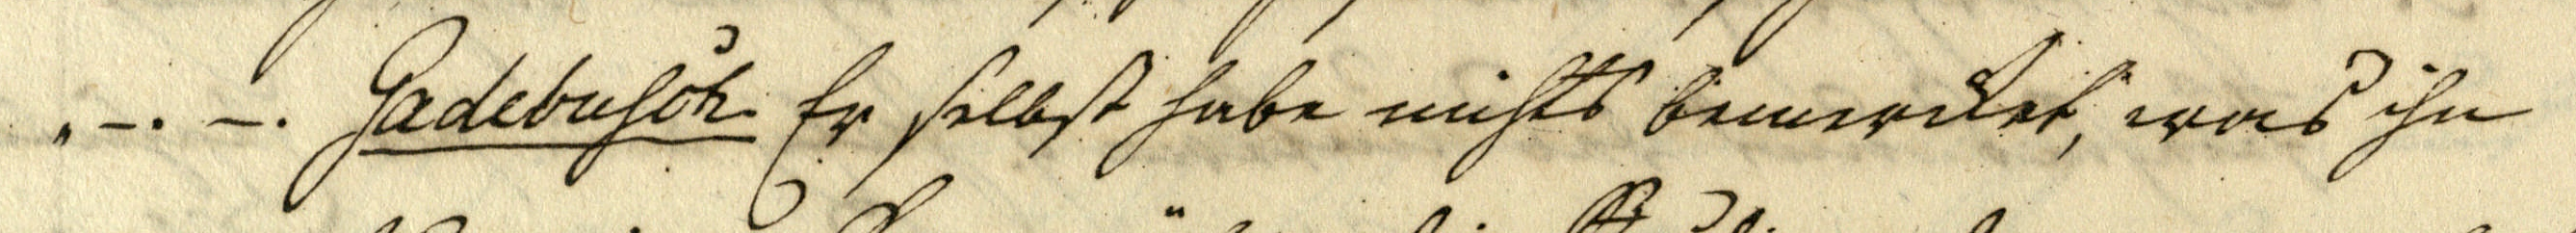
" - " - " Gadebusch. Er selbst habe nichts bemerket, was ihn
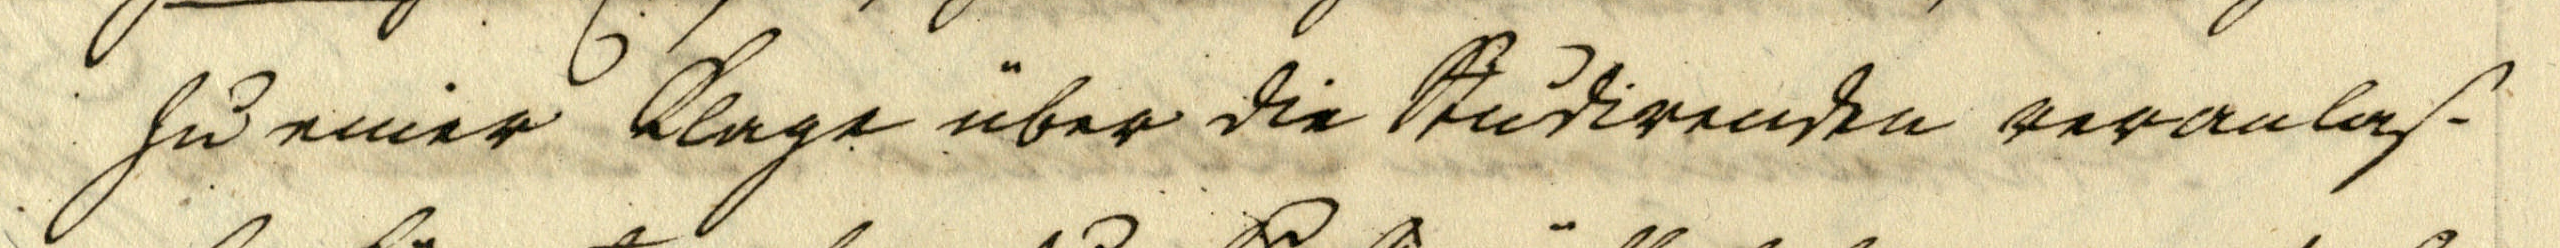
zu einer Klage über die Studirenden veranlas-
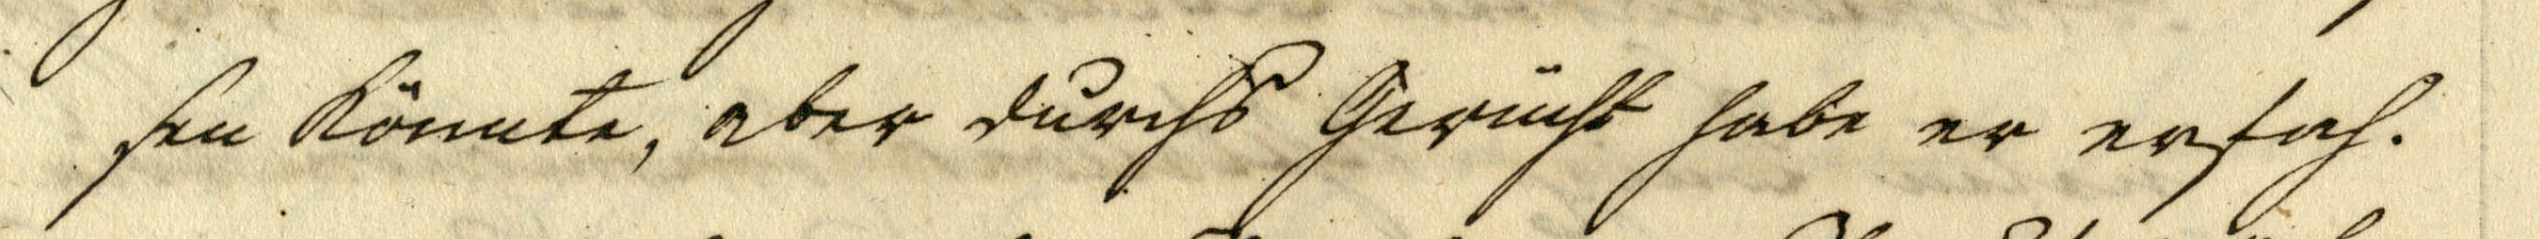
sen könnte, aber durchs Gerücht habe er erfah-
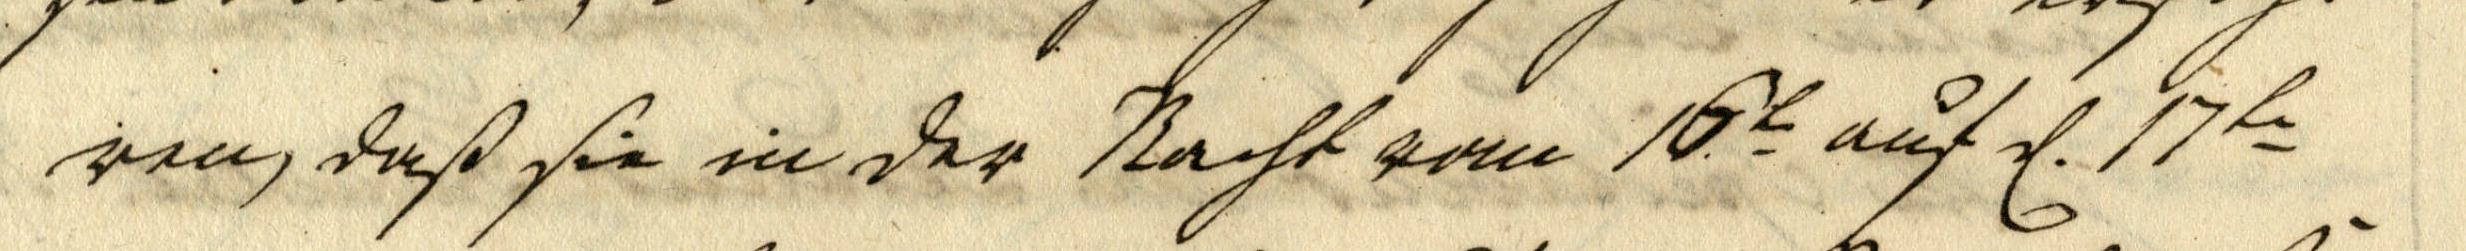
ren, daß sie in der Nacht vom 16ten auf d. 17ten
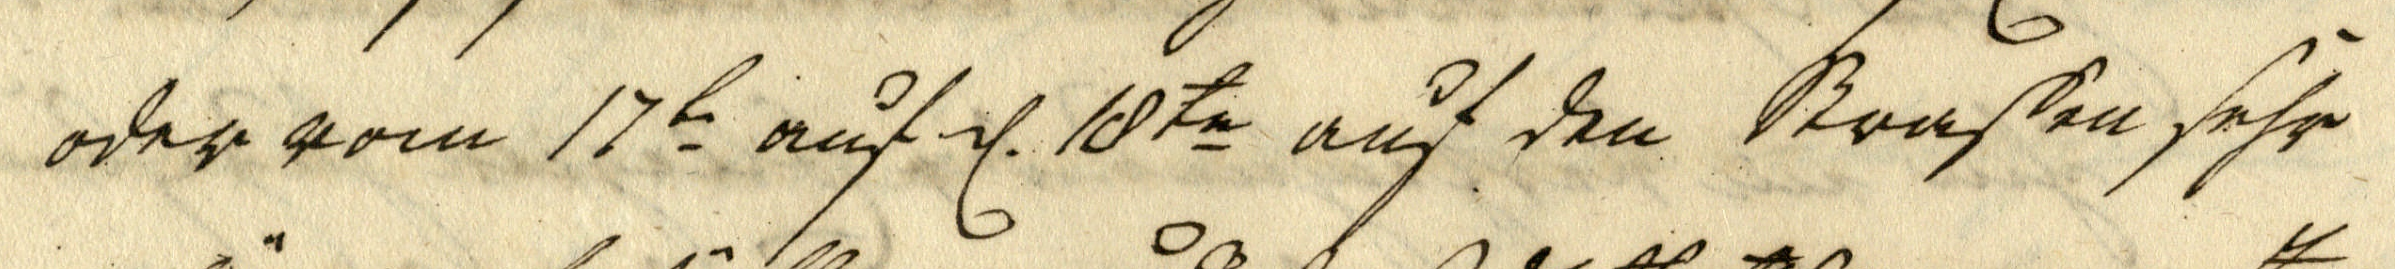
oder vom 17ten auf d. 18ten auf den Strassen sehr
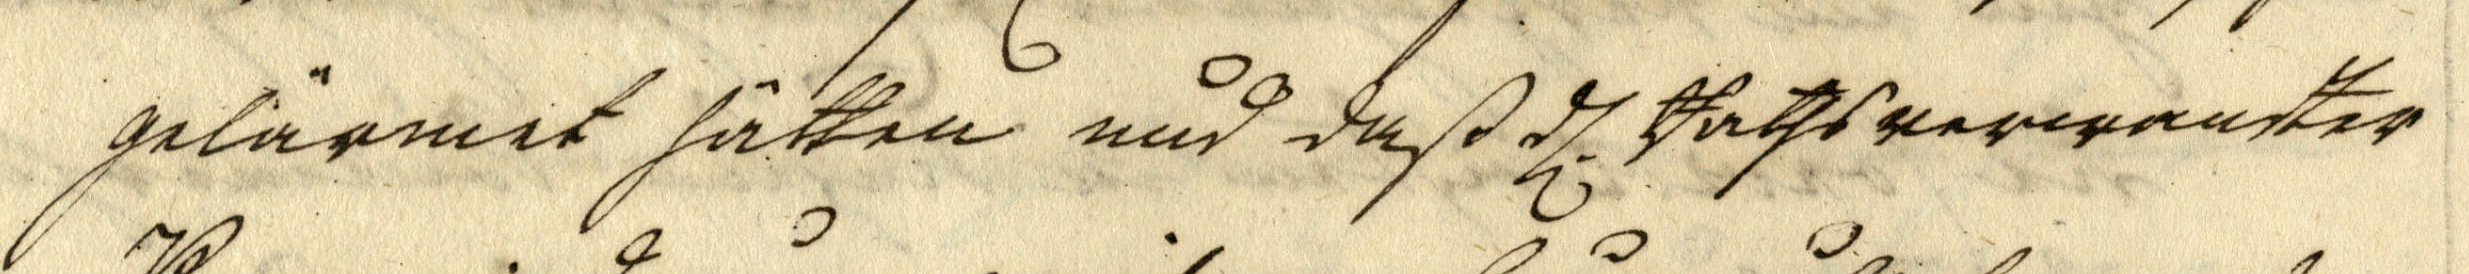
gelärmet hätten und daß dh. Rathsverwandter
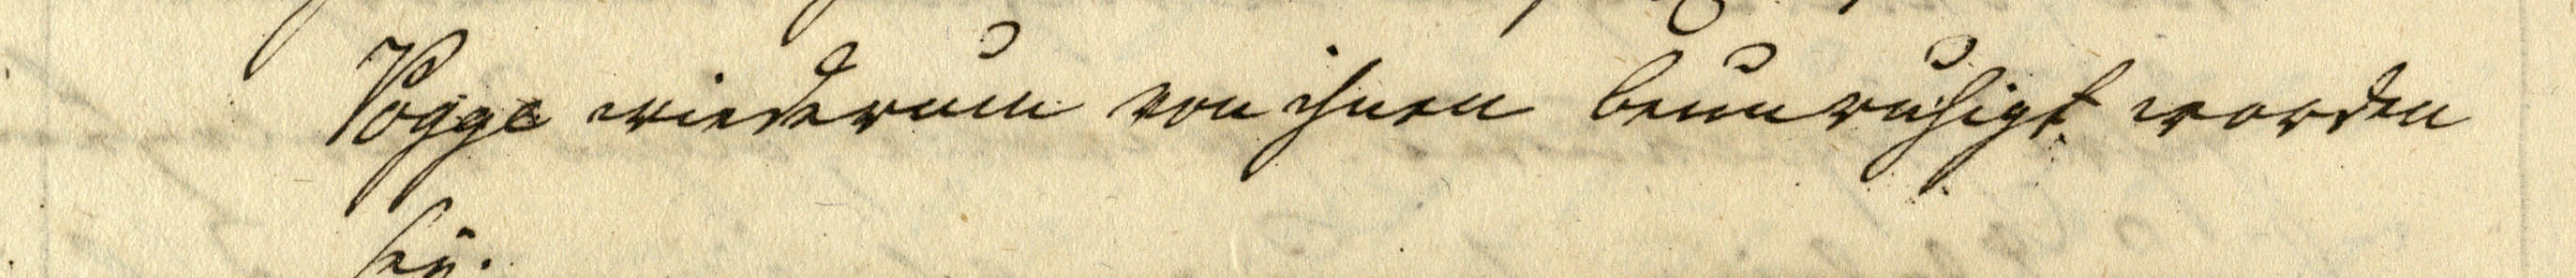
Pogge wiederum von ihnen beunruhiget worden
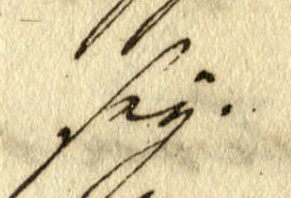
sey.
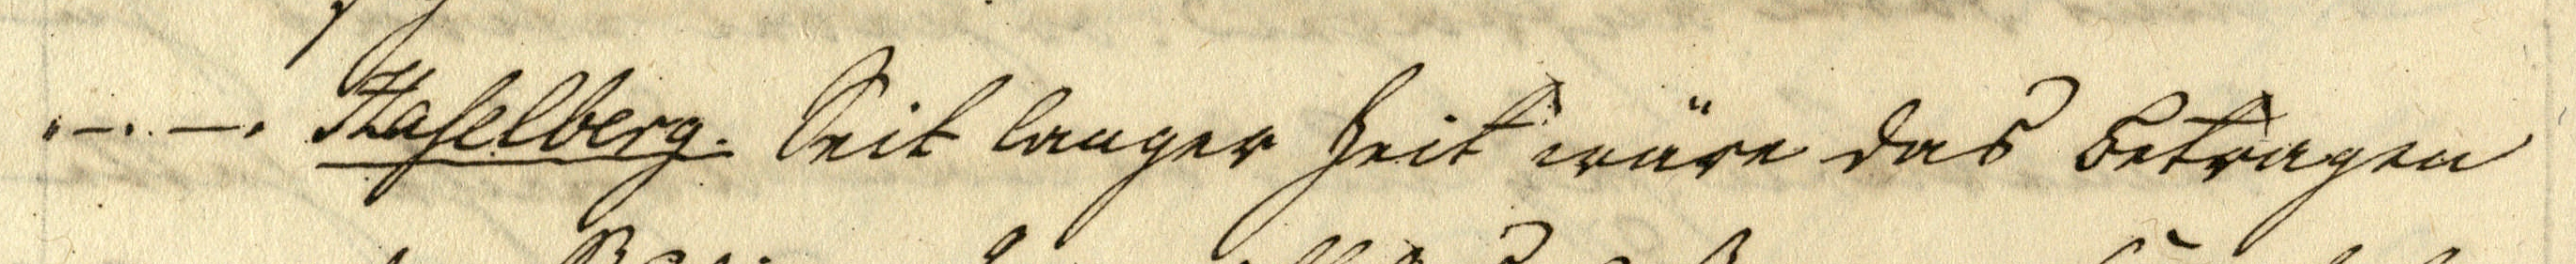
" - " - " Haselberg. Seit langer Zeit wäre das Betragen
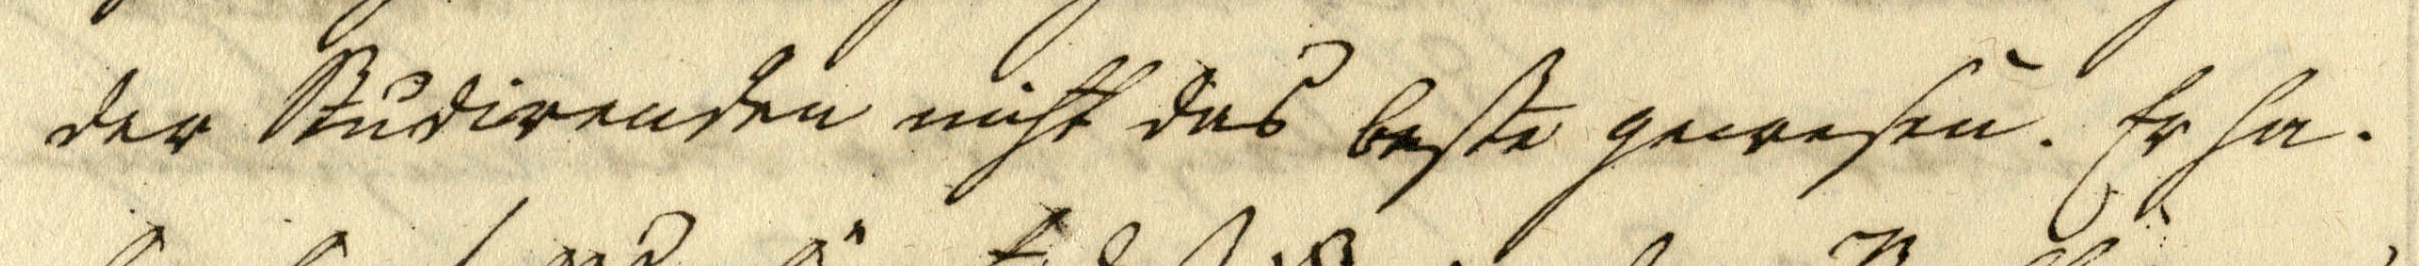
der Studirenden nicht das beste gewesen. Er ha-
